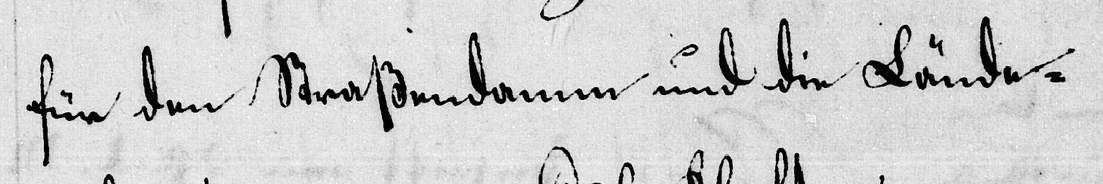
für den Straßendamm und die Lände¬
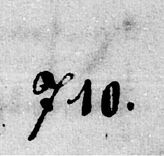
710.
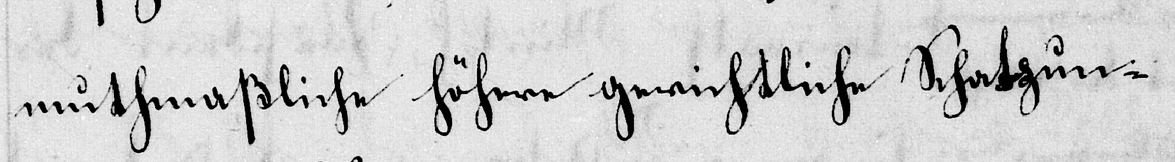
muthmaßliche höhere gerichtliche Schatzun¬
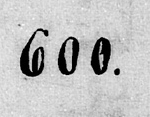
600.
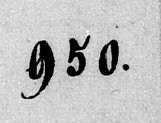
950.
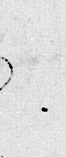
nern
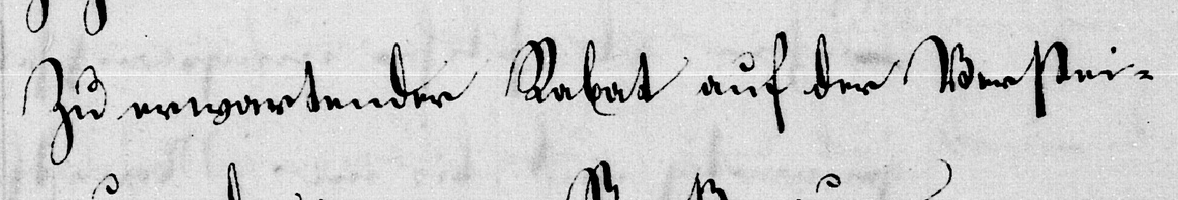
Zu erwartender Rabat auf der Verstei¬
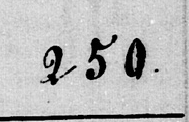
250.
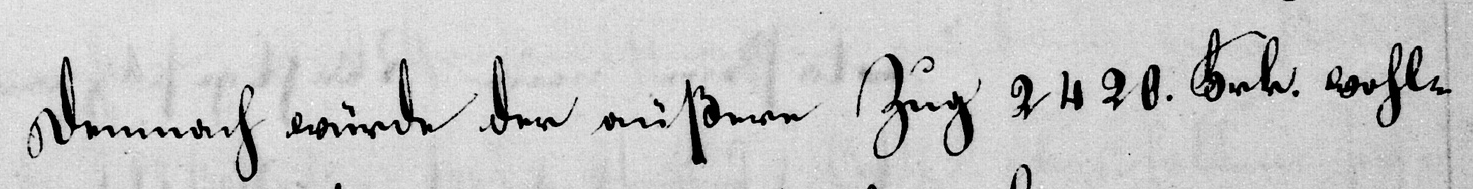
Demnach würde der äußere Zug 2420. Frk. wohl¬
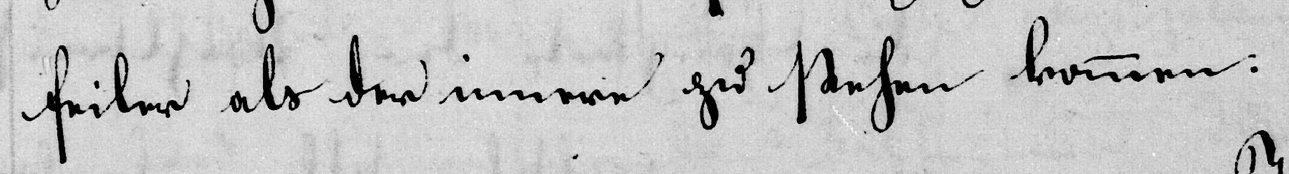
feiler als der innere zu stehen kommen:
